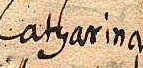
Catharina
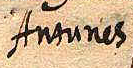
Antunes
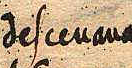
desceuaua
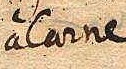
a Carne
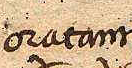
oracam
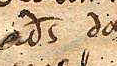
a d̄s dos
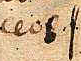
ceos |
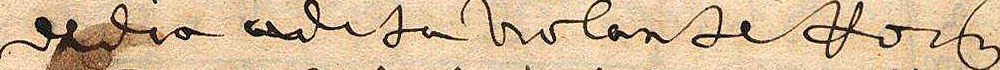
de dia a dita violante Roiz̄
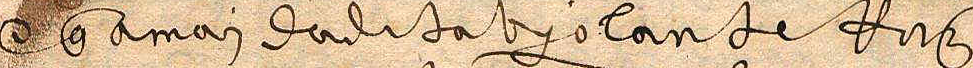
e q̄ a maj da dita vyolante Roiz̄
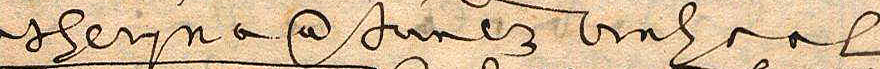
catherjna ātunez vinha aL
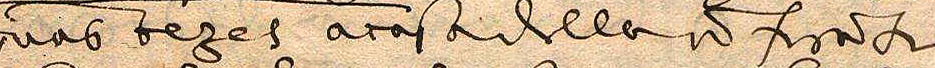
gūas vezes a casa della cōfesāte
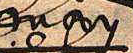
may
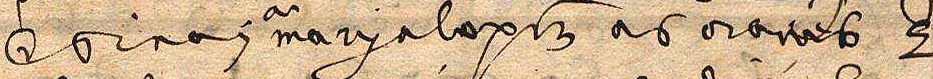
ēsinaj a marya lopez as orações E
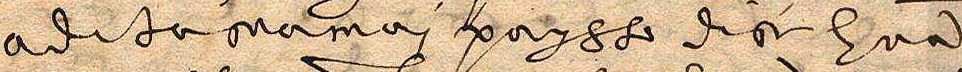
a dita sua maj por ysso dise huā
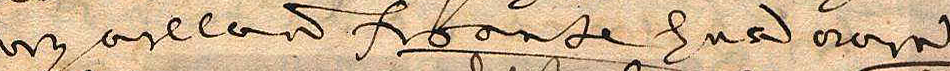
vez a ella cōfesante huā oraçā
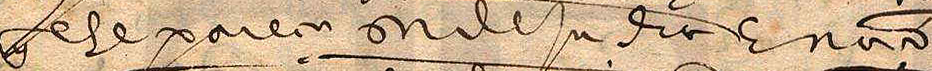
q̄ lhe pareçe ser de Judia E naõ
